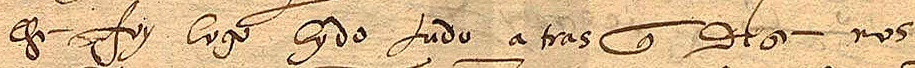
lhe foy logo lydo tudo atras q̄ dise nos
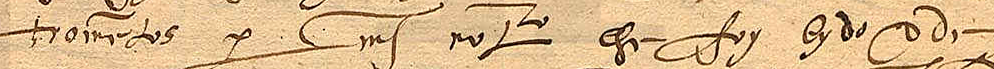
tromētos ꝑ m̄j notro lhe foy lydo e de
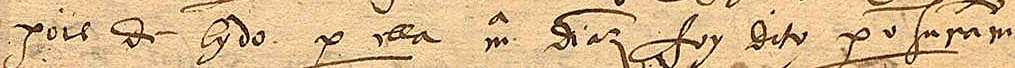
pois de lydo ꝑ ella ma diaz foy dito ꝑ o Juramto
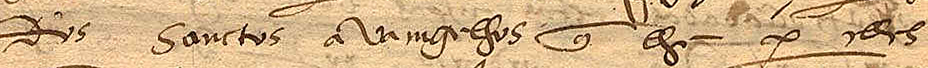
dos Sanctos avamgelhos q̄ lhe ꝑ elles
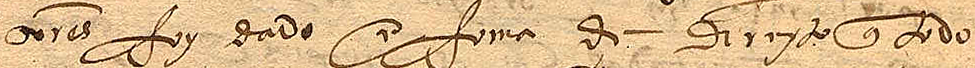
sōres foy dado ē foma de direyto q̄ todo
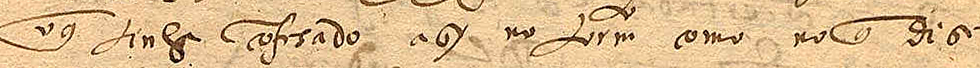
o q̄ tinha c̄ofesado asy no tormto como no q̄ dise
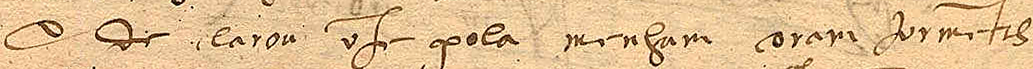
e declarou ōje pola menham coram torm̄etis
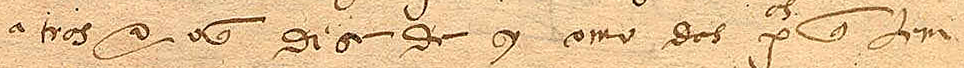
atras e o q̄ dise de sy como das pas q̄ tem
